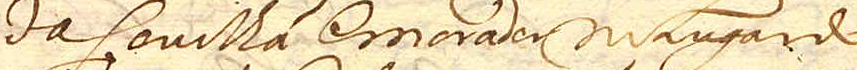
da Couilhã E morador no Lugar do
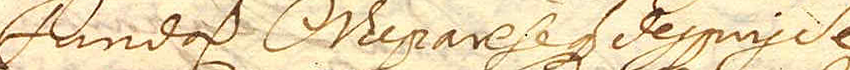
Fundaõ E lhe parece q̄ despois Se
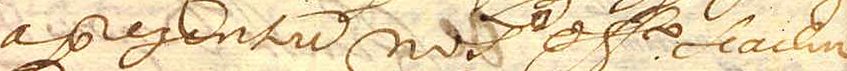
aprezentou no S.to off.co se achou
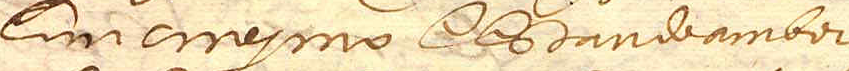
Com o mesmo E Estando ambos
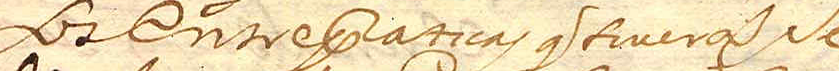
Sos Entre praticas q̄ tiveraõ Se
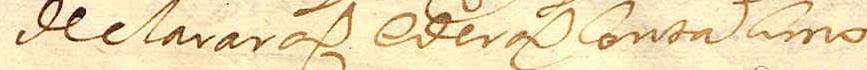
declararaõ e deraõ Conta Como
